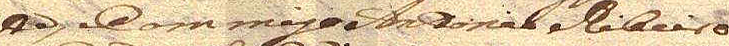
te, e commigo Antonio Ribeiro
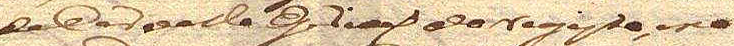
de Carvalho Escrivaꝭ do registo, no
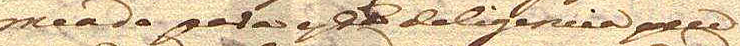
meado para esta deligencia que
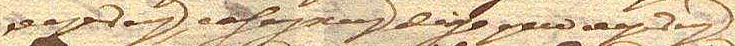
o escrevy, e asegney digo que o escrevy
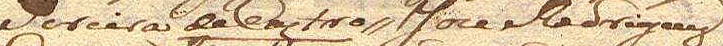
Pereira de Castro// Joze Rodrigues
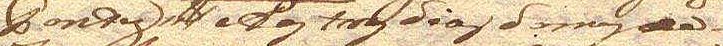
Pontez// ? Aos tres dias do mes de
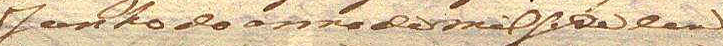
Junho do anno de mil setecen
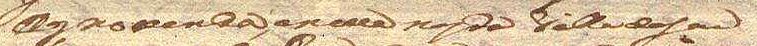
tos noventa, e nove nesta villa de san
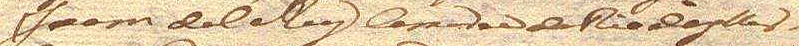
Joam del Rey Comarca do Rio das Mor
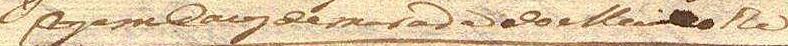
tes em cazas de morada do Muito Re
